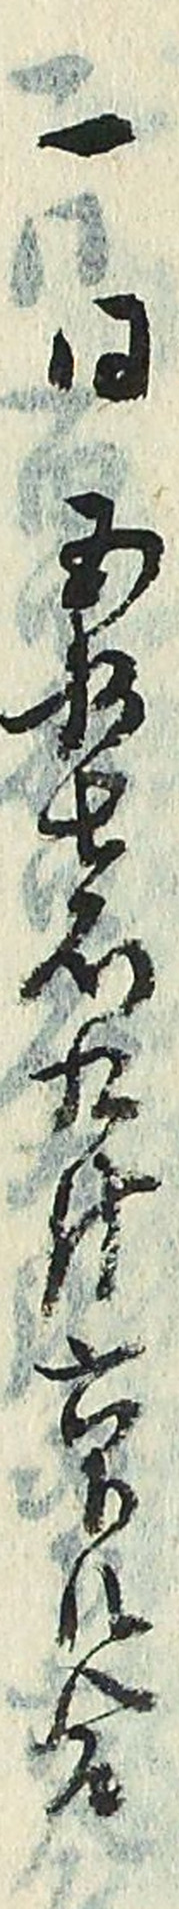一同五拾七石九斗六升八合
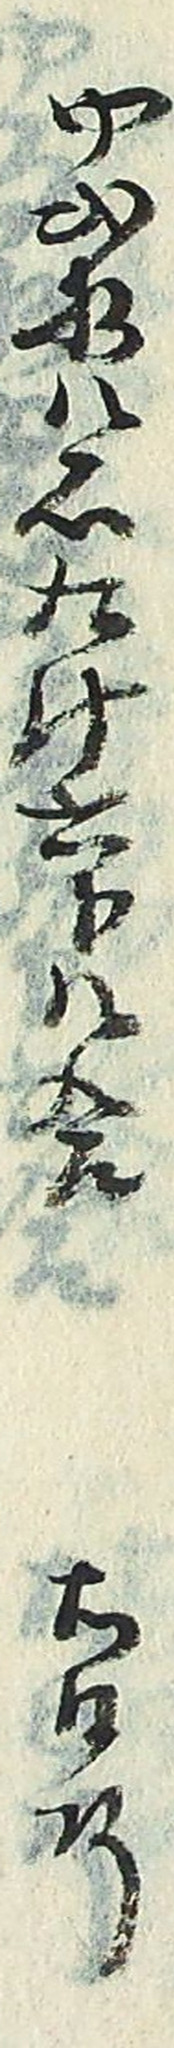内廿八石九斗六升八合右同断
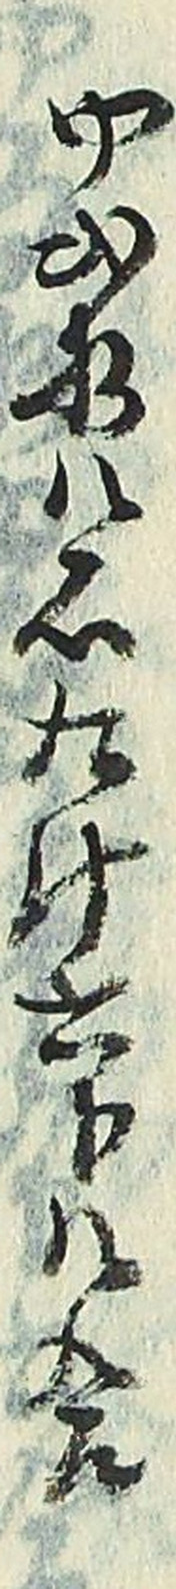一同五拾七石九斗六升八合
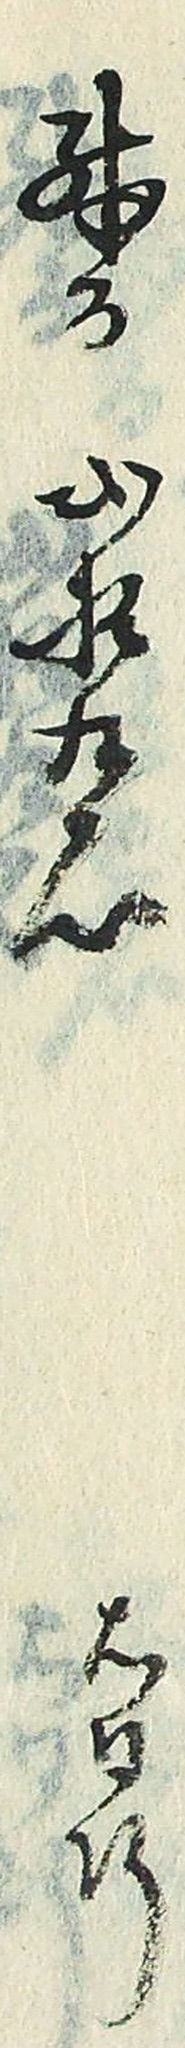残而弐拾九石右同断
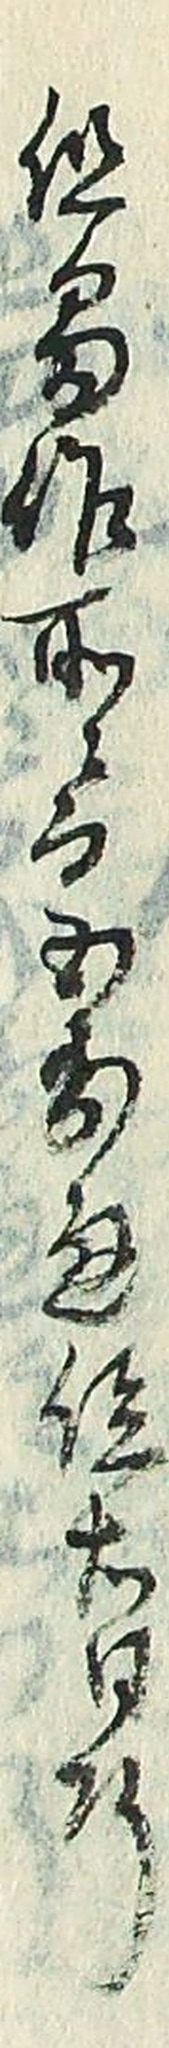但畠作所ニ而五歩通位右同断

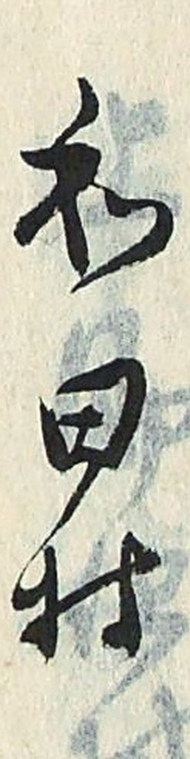和田村
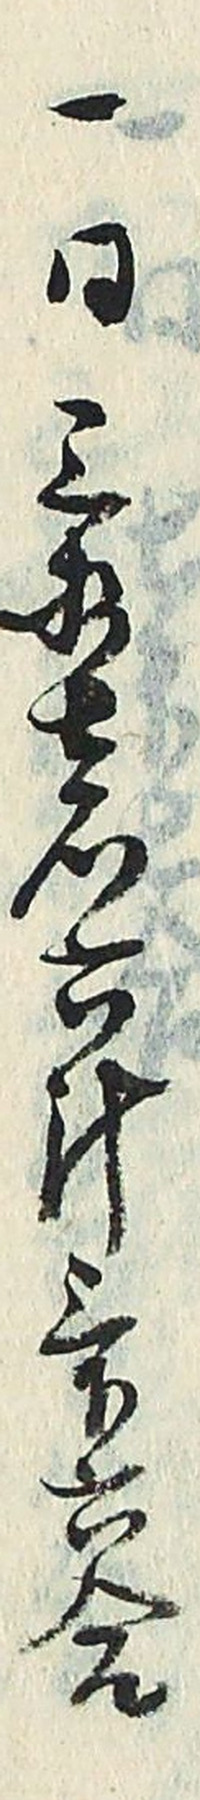一同三拾七石六斗三升六合
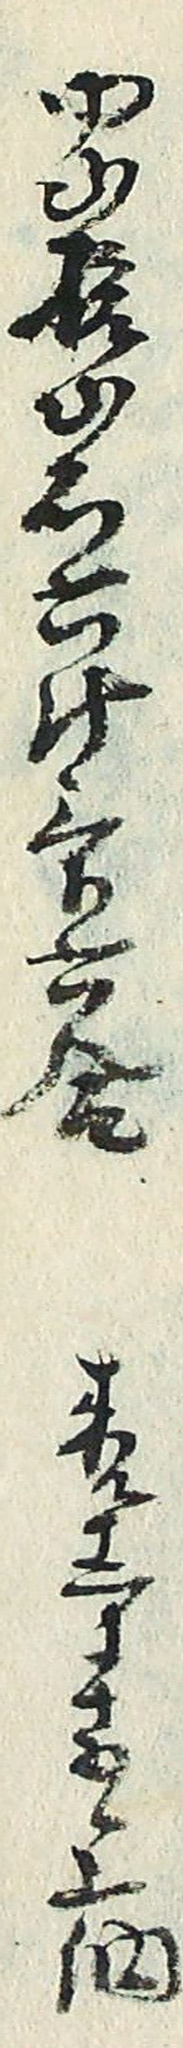内弐拾弐石六斗三升六合来ル十二月十五日上納
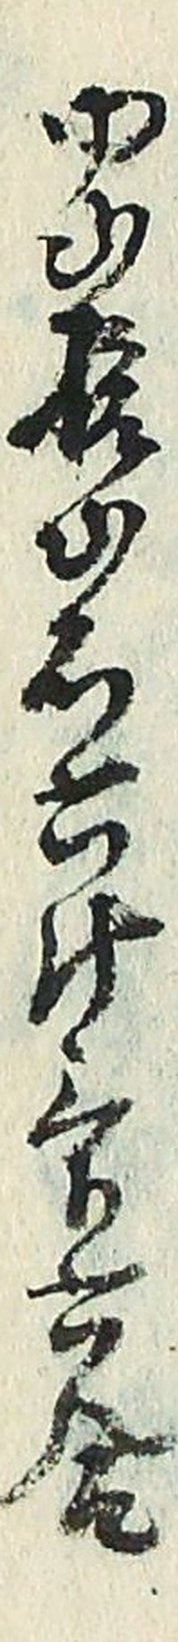一同三拾七石六斗三升六合
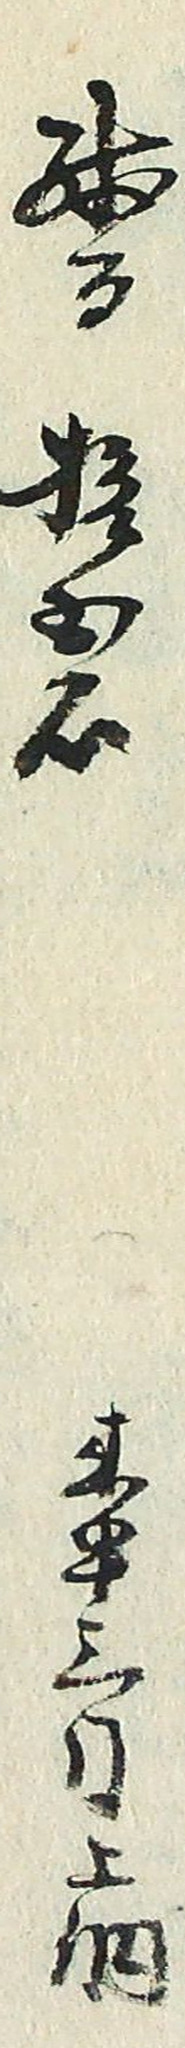残而拾五石来申三月上納
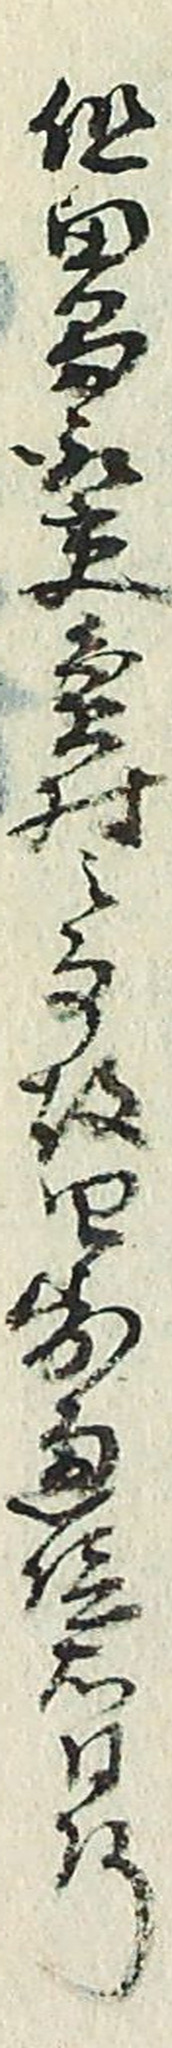但田畠取交貧村之事故四歩通位右同断
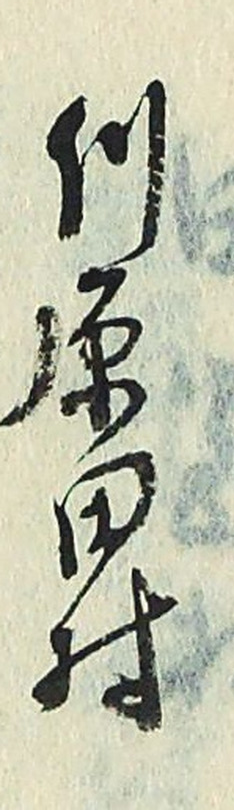川原田村
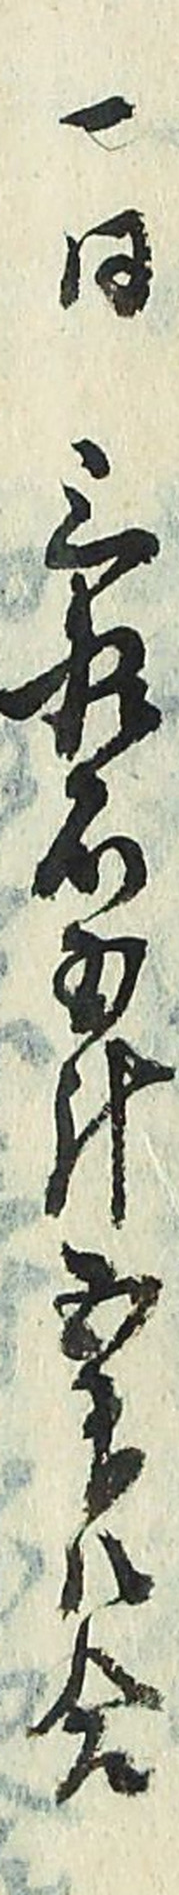一同三拾石五斗五升八合
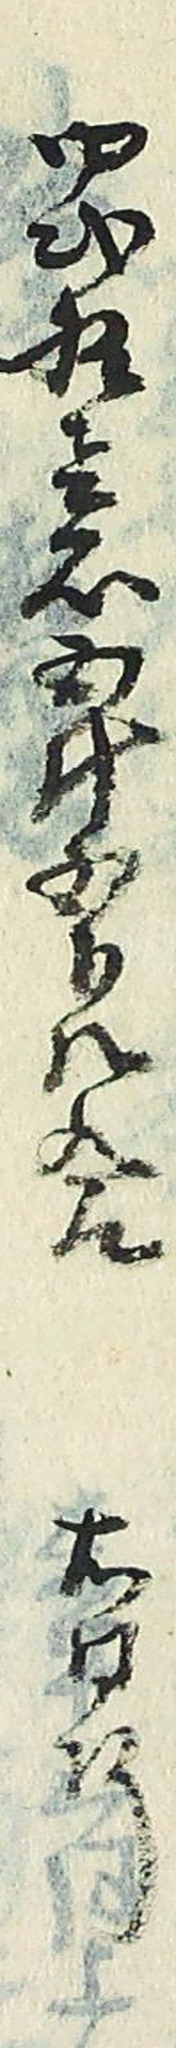内弐拾壱石五斗五升八合右同断
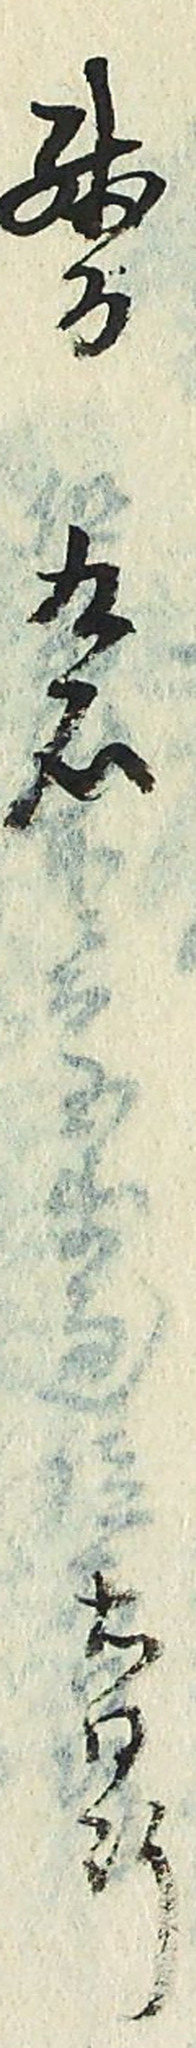残而九石右同断
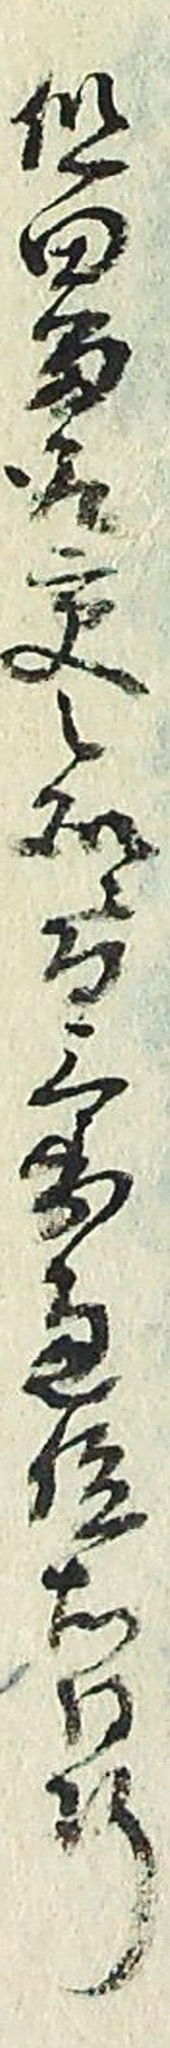但田畠取交貧村之処ニ而三歩通位右同断
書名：諸御趣意書并御下知向之写
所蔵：鳴門教育大学 Naruto University of Education
